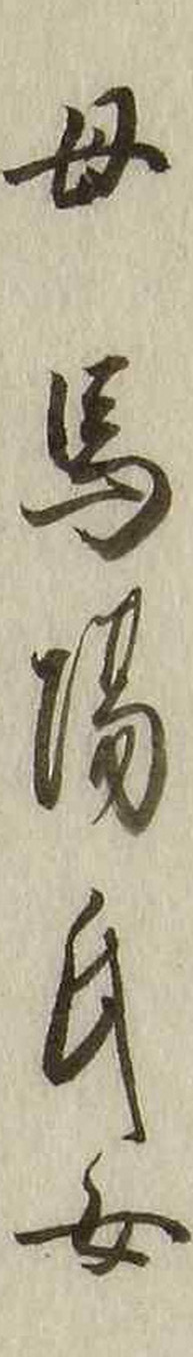母馬場氏女
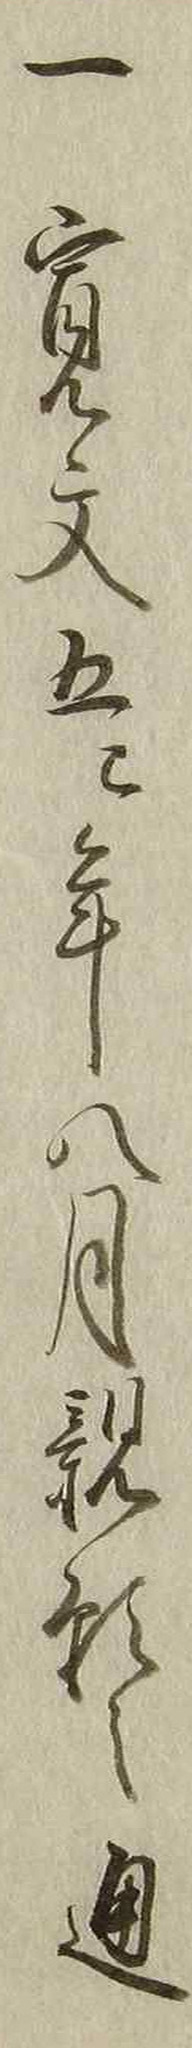一寛文五巳年八月親願之通
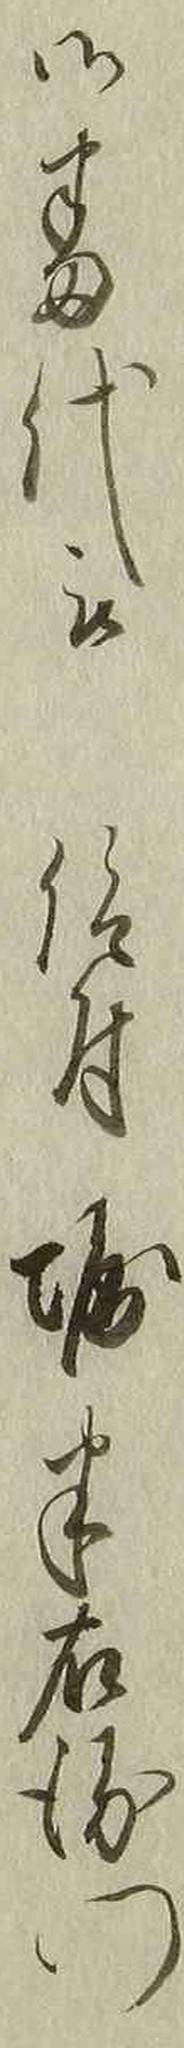御番代被仰付堀半右衛門
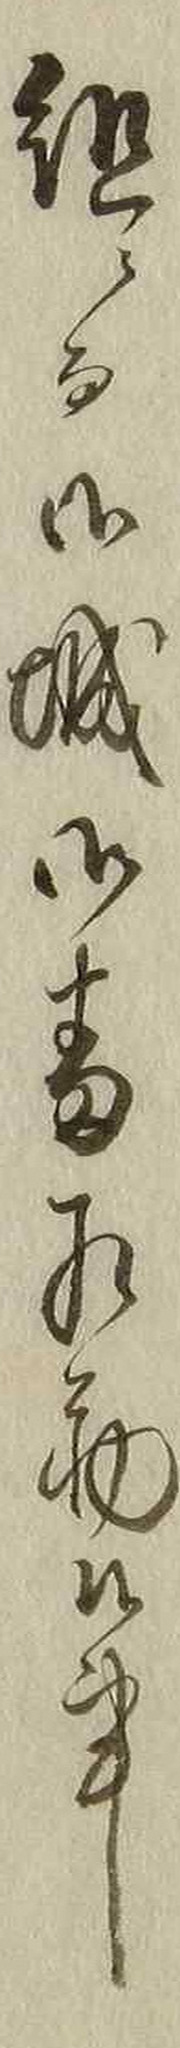組ニ而御城御番相勤候事
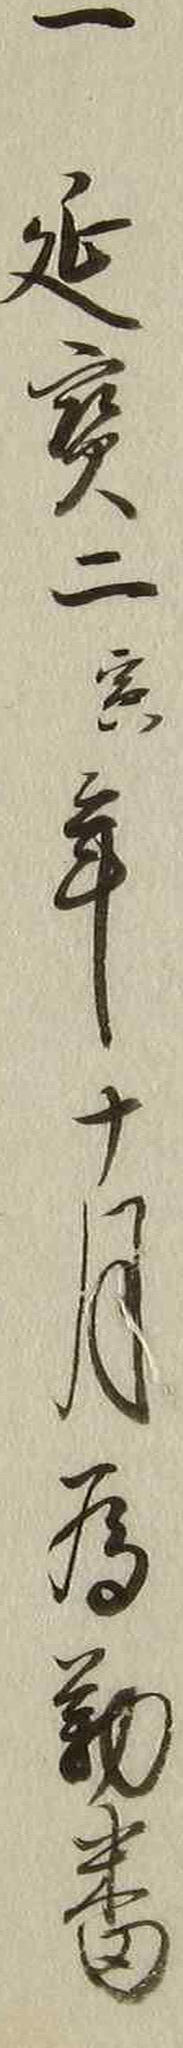一延宝二寅年十月為勤番
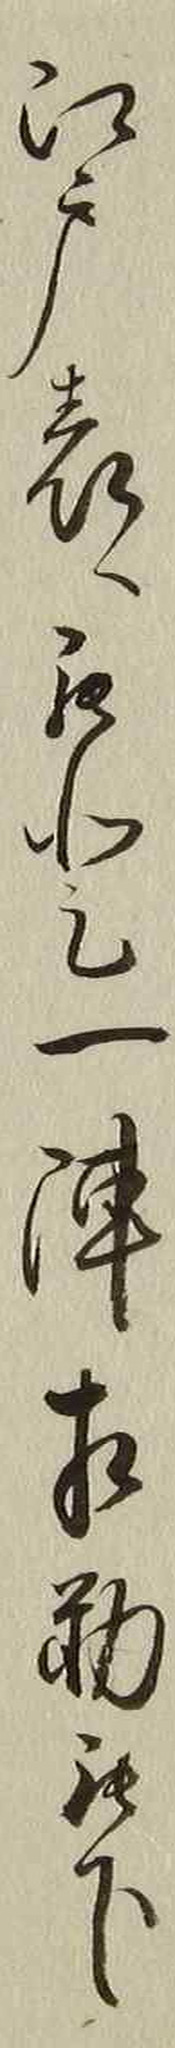江戸表へ罷登一陣相勤罷下
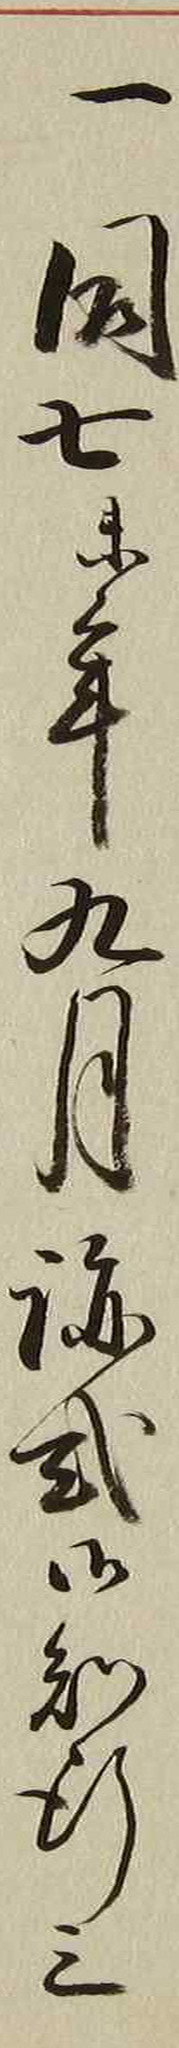一同七未年九月跡式御知行三
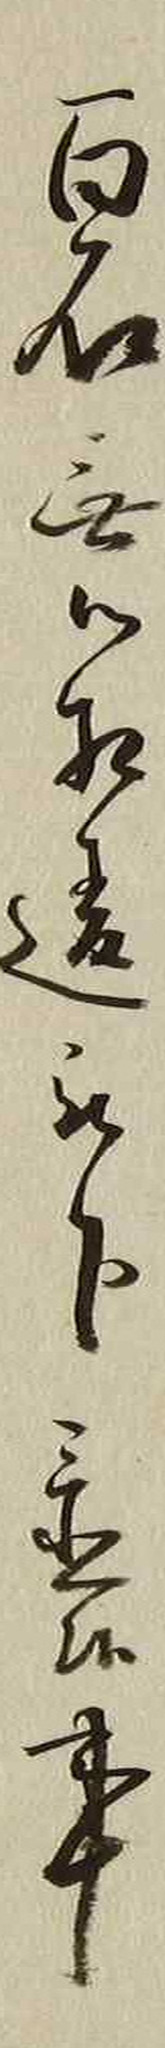百石無御相違被下置候事
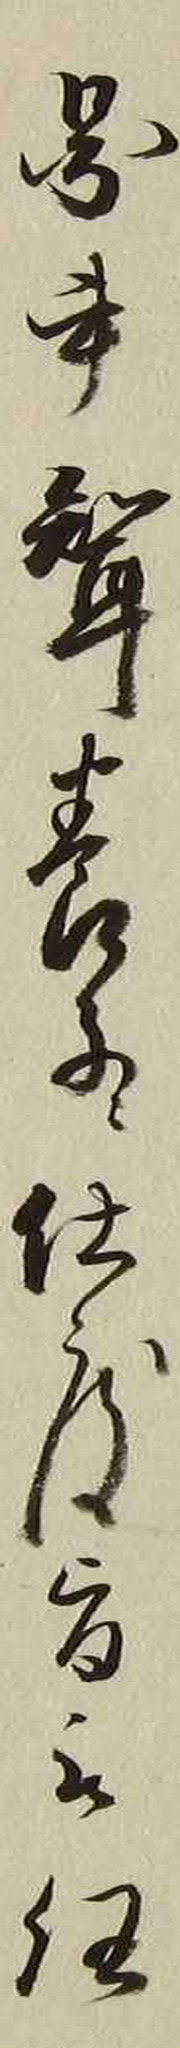図書聟養子ニ仕度旨被任
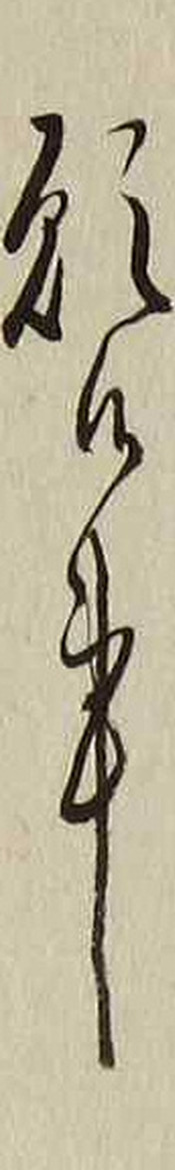願候事
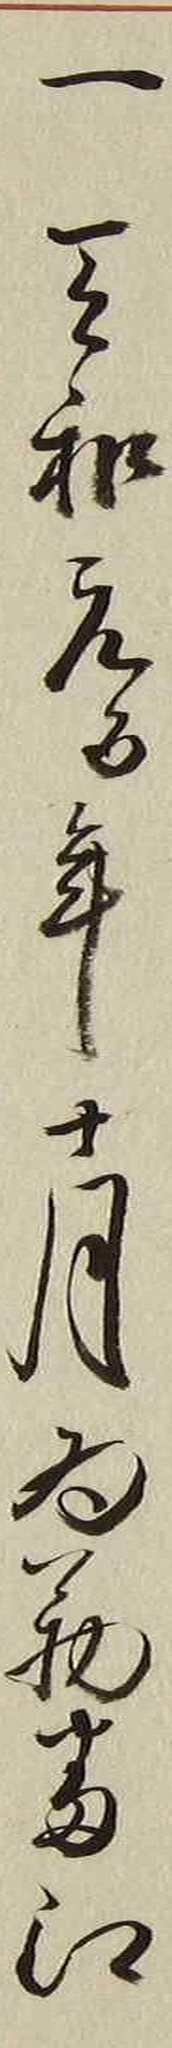一天和元酉年十月為勤番江
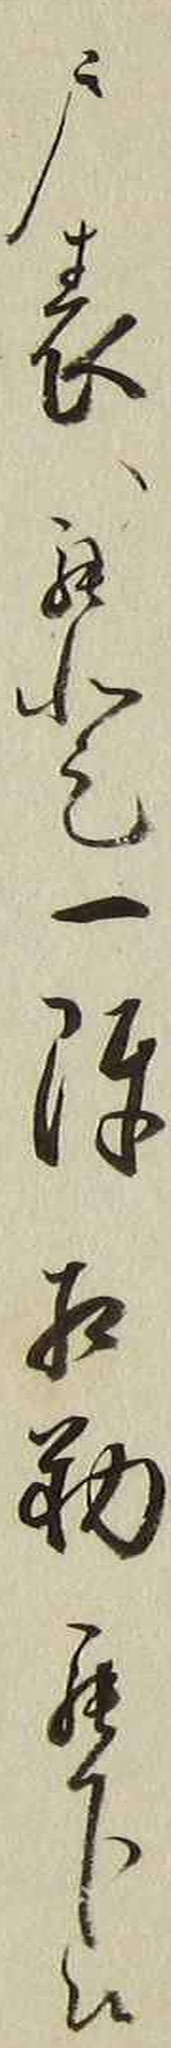戸表へ罷登一陣相勤罷下候
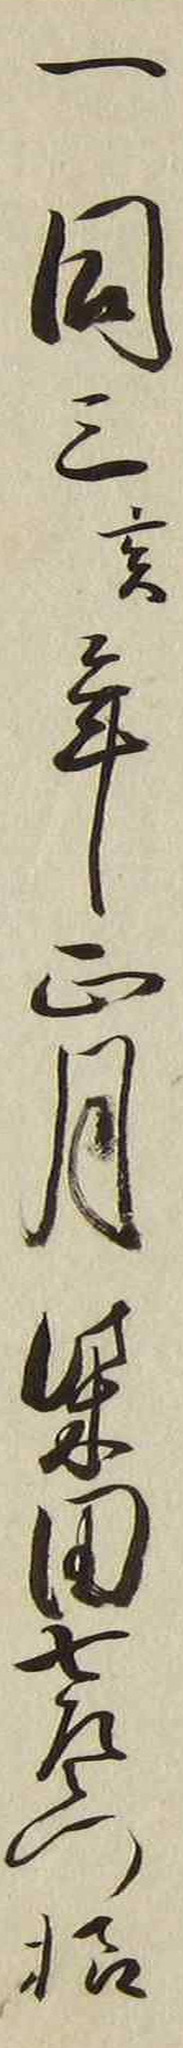一同三亥年正月柴田七左衛門様

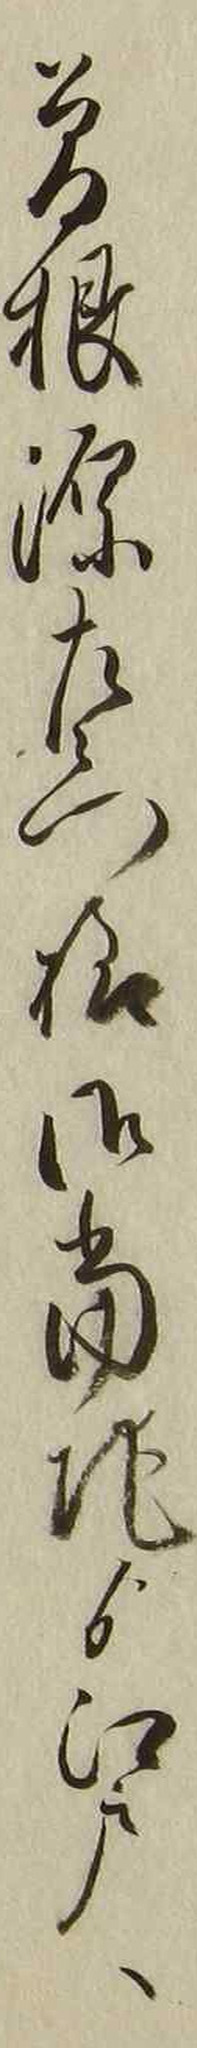曽根源左衛門様御当地ゟ江戸へ
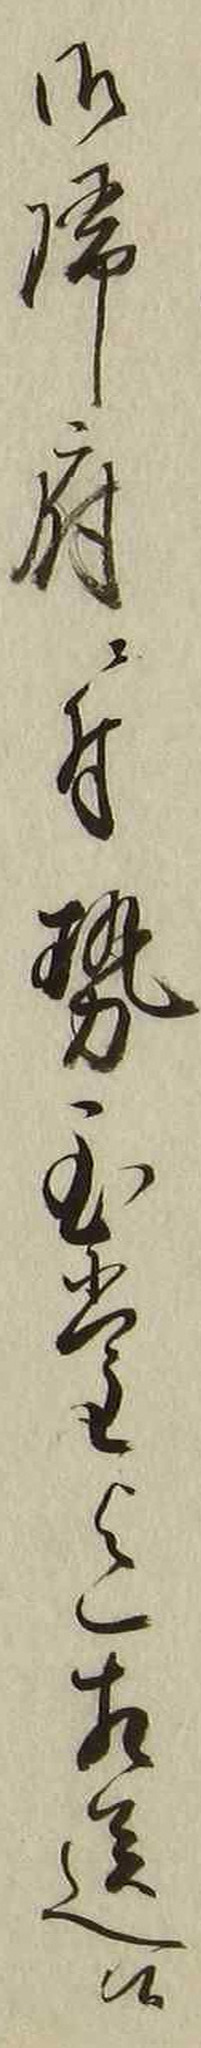御帰府ニ付勢至堂迄相送候
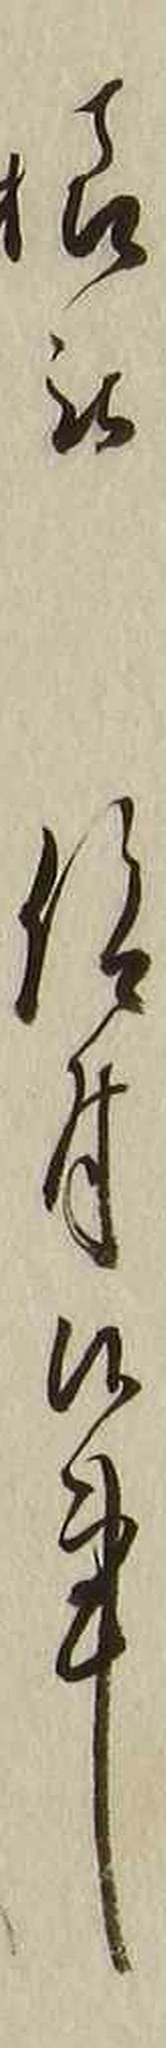様被仰付候事
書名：諸士系譜　巻之18　い之部18
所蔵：会津若松市立会津図書館
